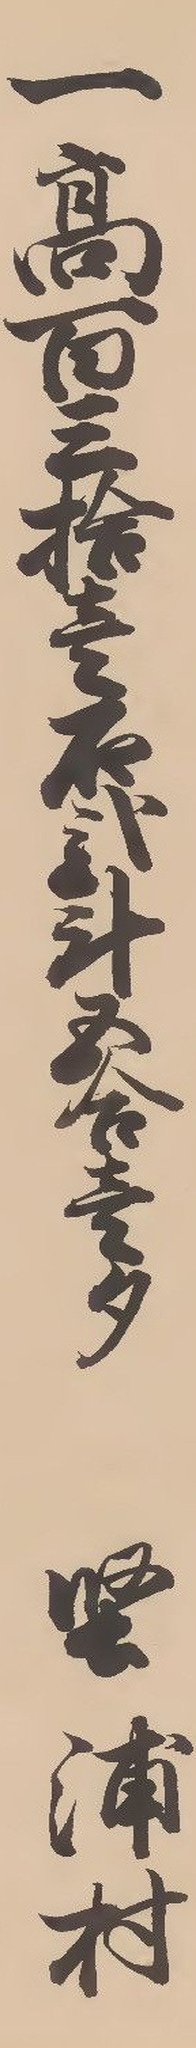一高百三拾壱石弐斗五合壱勺堅浦村
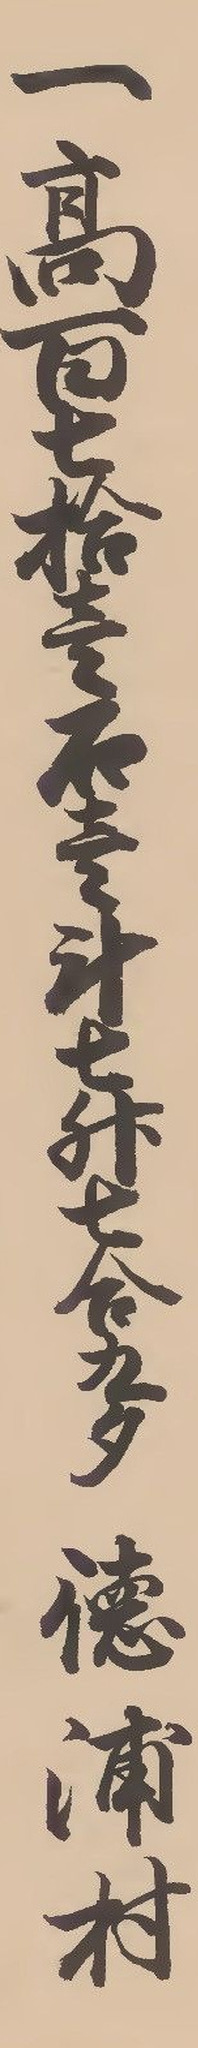一高百七拾壱石壱斗七升七合九勺徳浦村

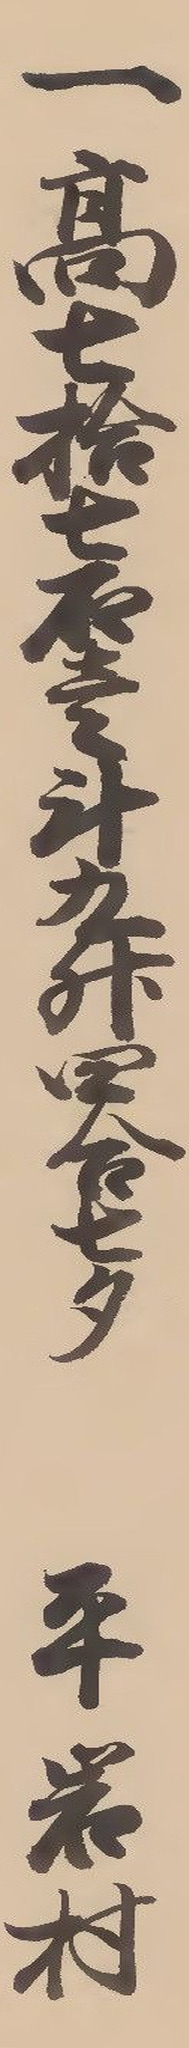一高七拾七石壱斗九升四合七勺平岩村
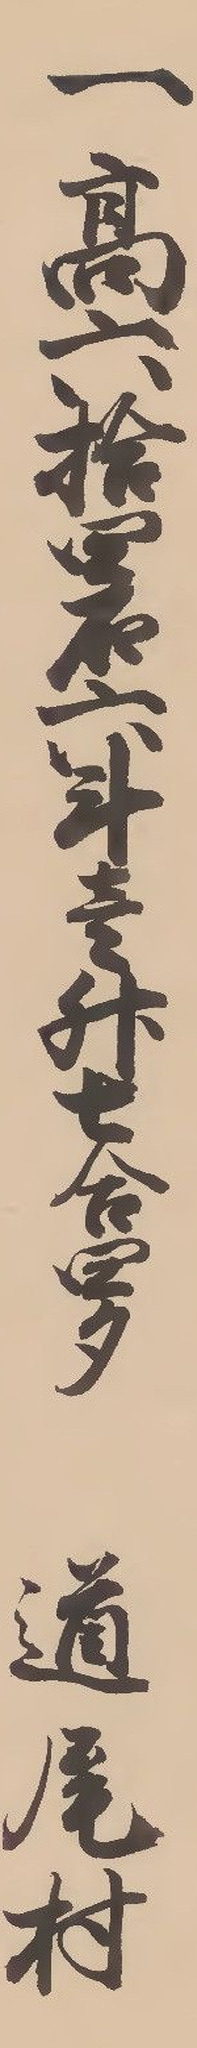一高六拾四石六斗壱升七合四勺道尾村
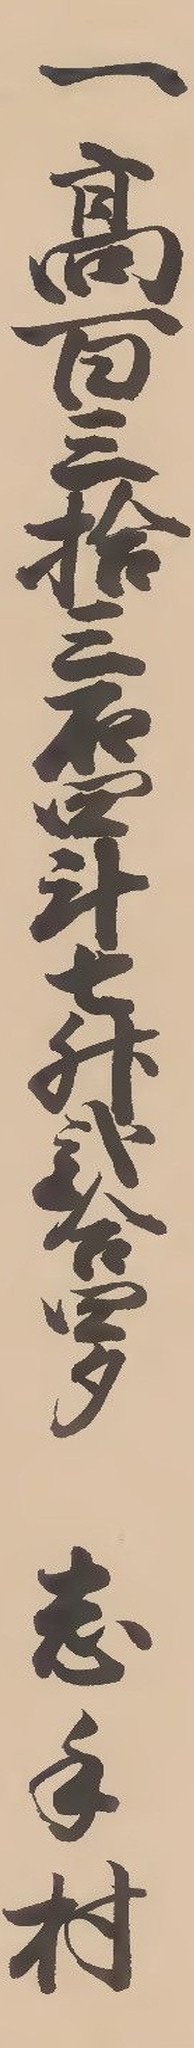一高百三拾三石四斗七升弐合四勺志手村
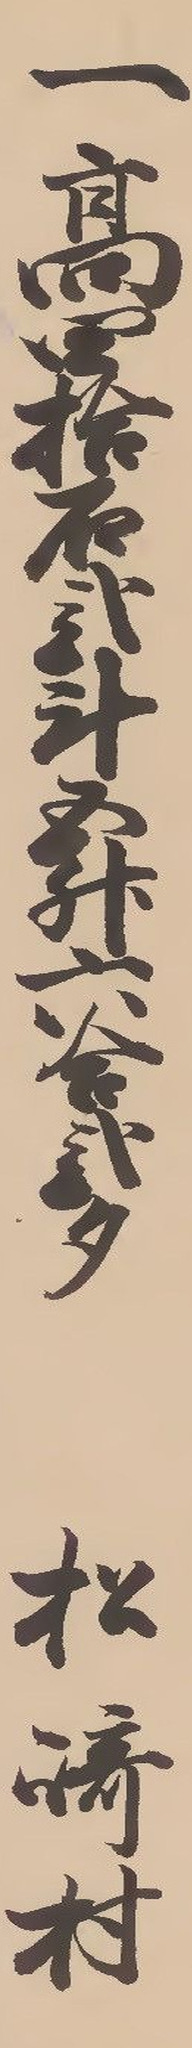一高四拾石弐斗五升六合弐勺松崎村
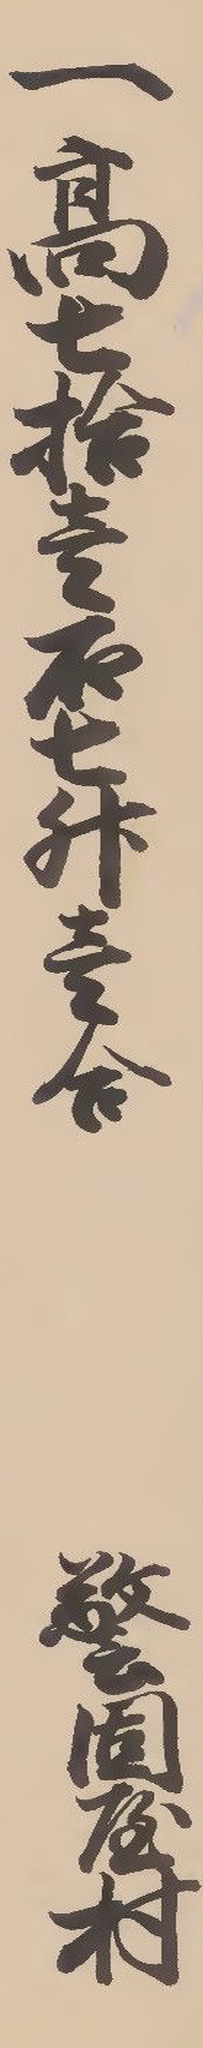一高七拾壱石七升壱合警固屋村
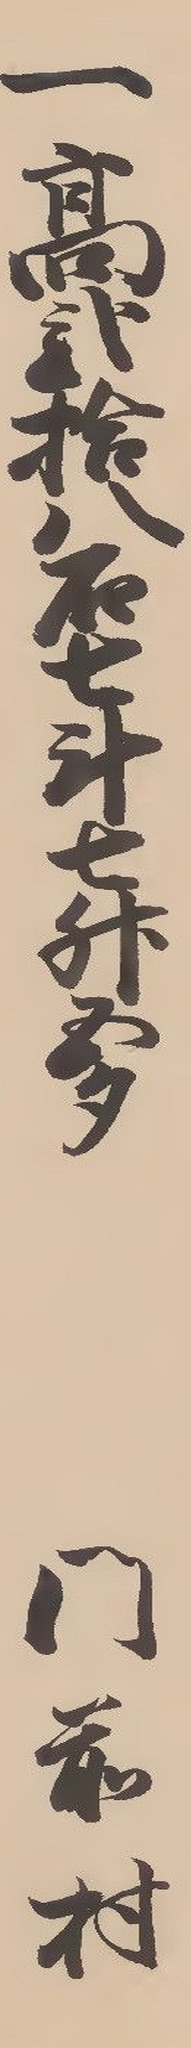一高弐拾八石七斗七升五勺門前村
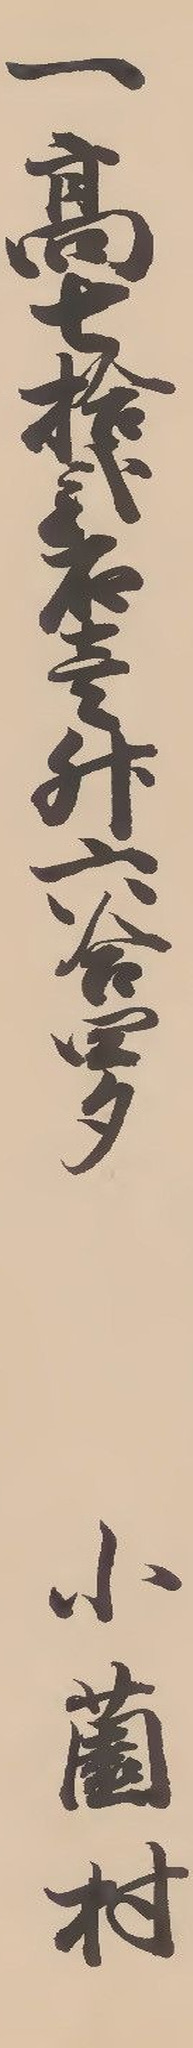一高七拾弐石壱升六合四勺小薗村
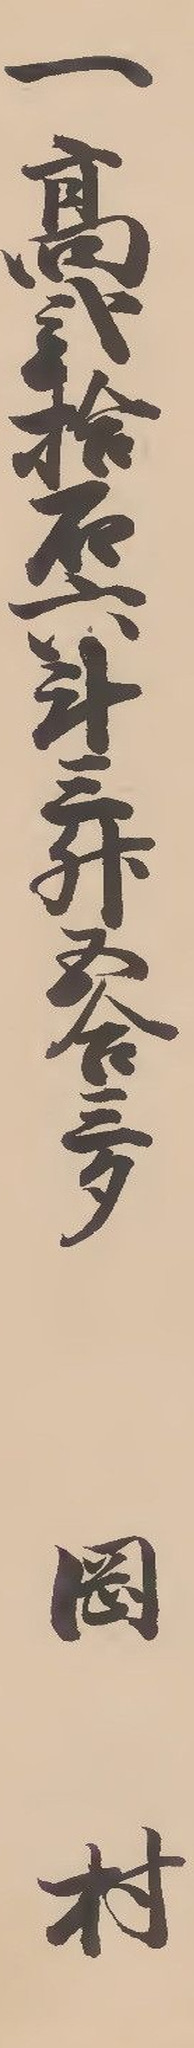一高弐拾石六斗三升五合三勺岡村

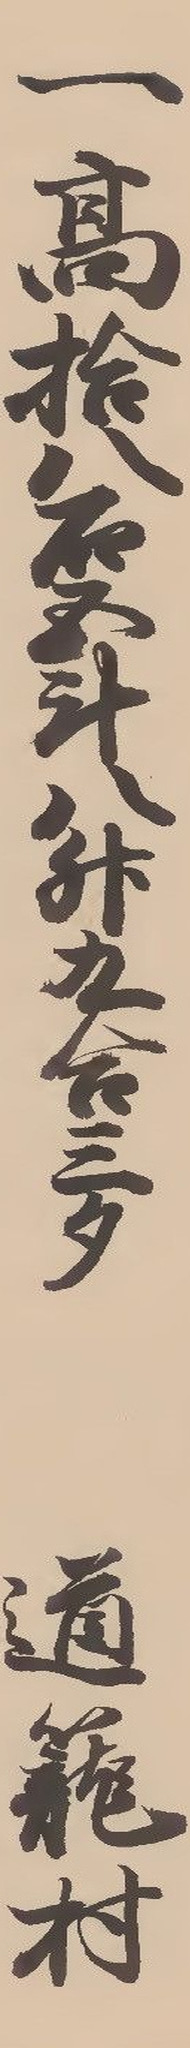一高拾八石五斗八升九合三勺道籠村
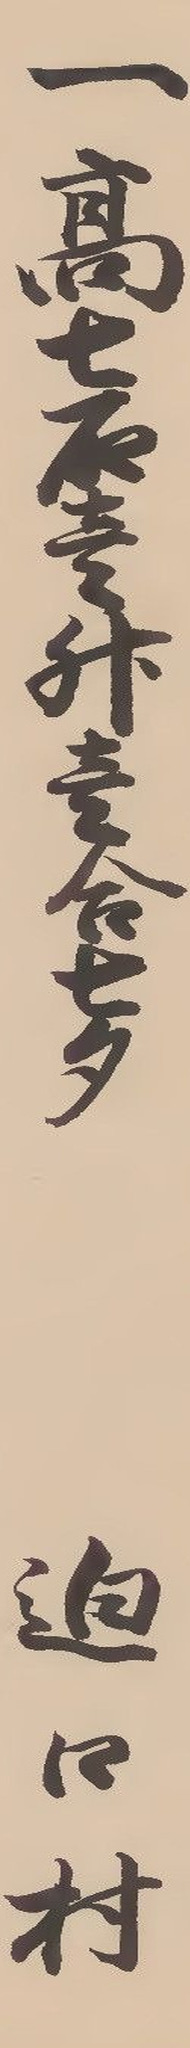一高七石壱升壱合七勺迫口村
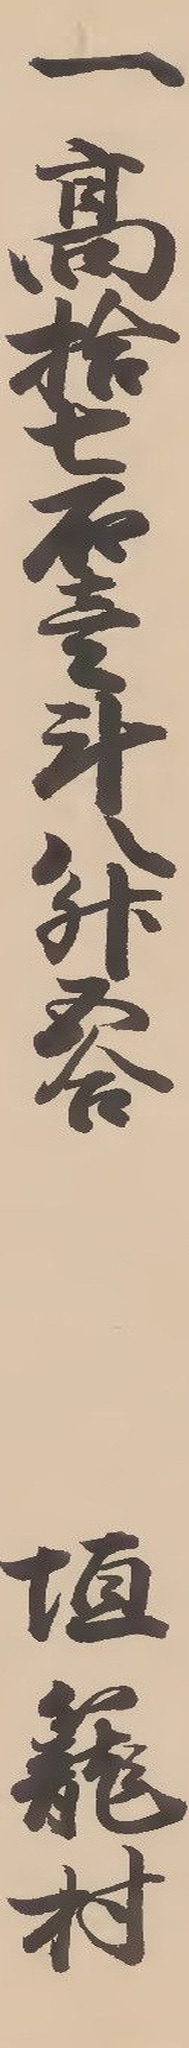一高拾七石壱斗八升五合垣籠村
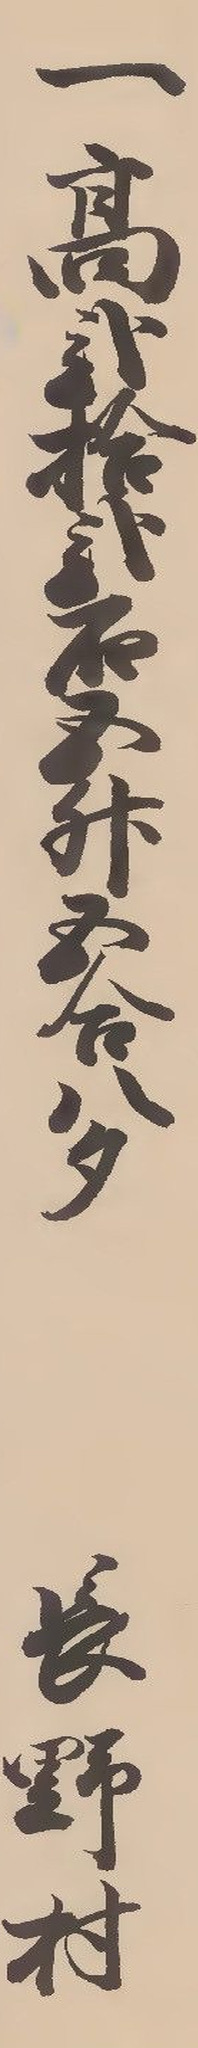一高弐拾弐石五升五合八勺長野村
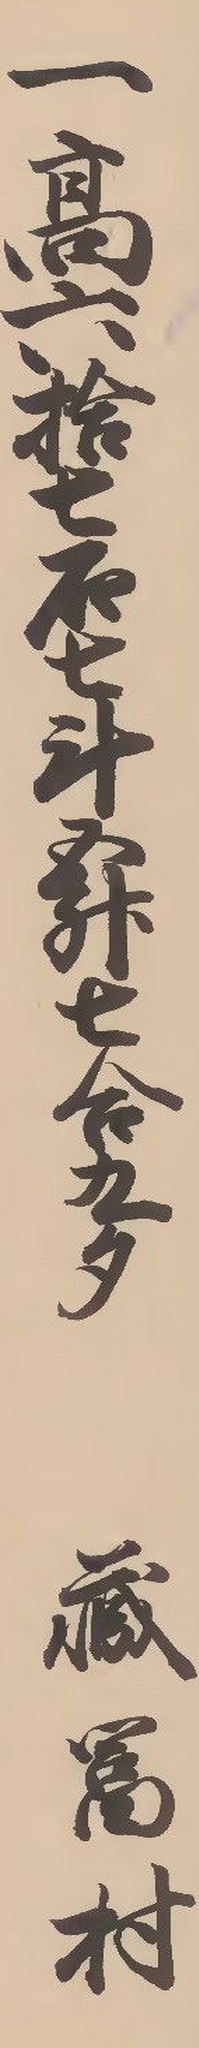一高六拾七石七斗五升七合九勺蔵富村
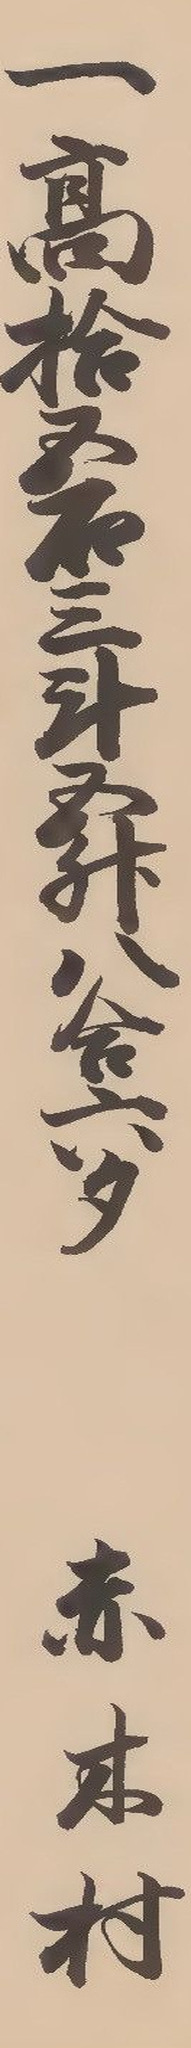一高拾五石三斗五升八合六勺赤木村
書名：豊後国郷帳
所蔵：国立公文書館 National Archives of Japan
